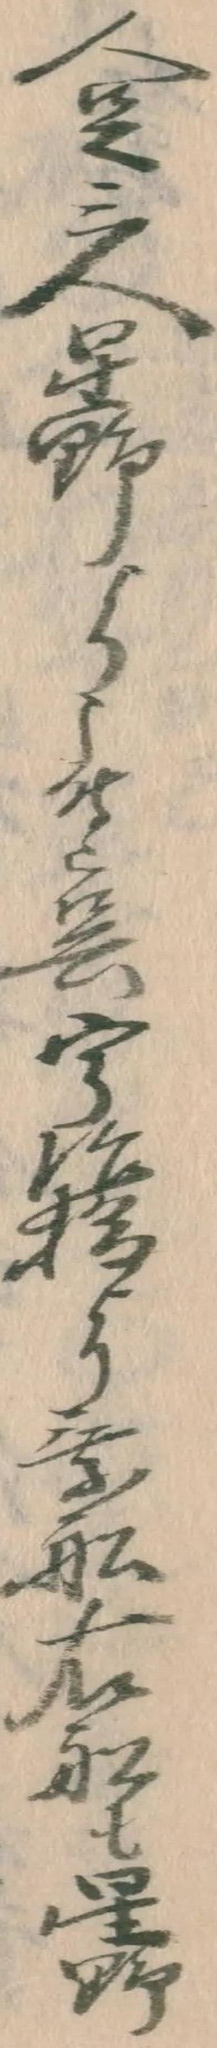人足三人星野より申付被呉宇治橋より乗舩右舩も星野
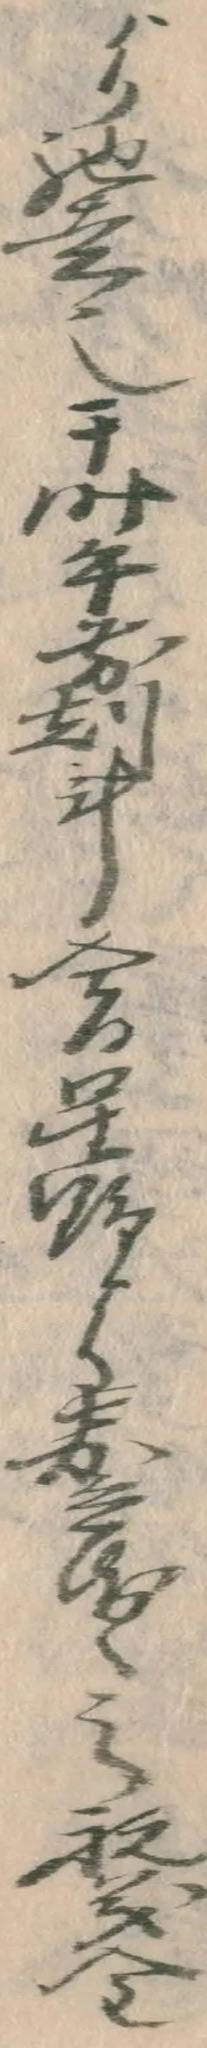より馳走也于時午前刻斗今日星野より嘉兵衛へ之祝義金
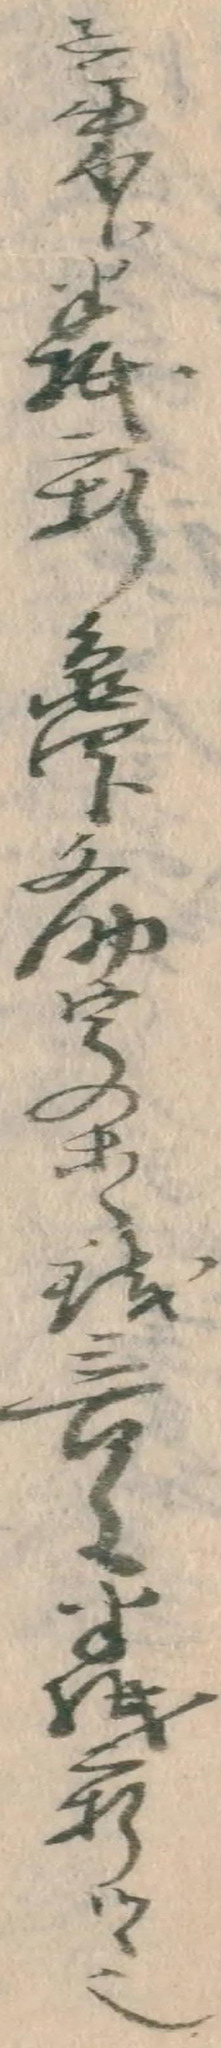壱朱ハ半紙二折亀四郎文助うの等へ銭三百文半紙二折ツヽ也
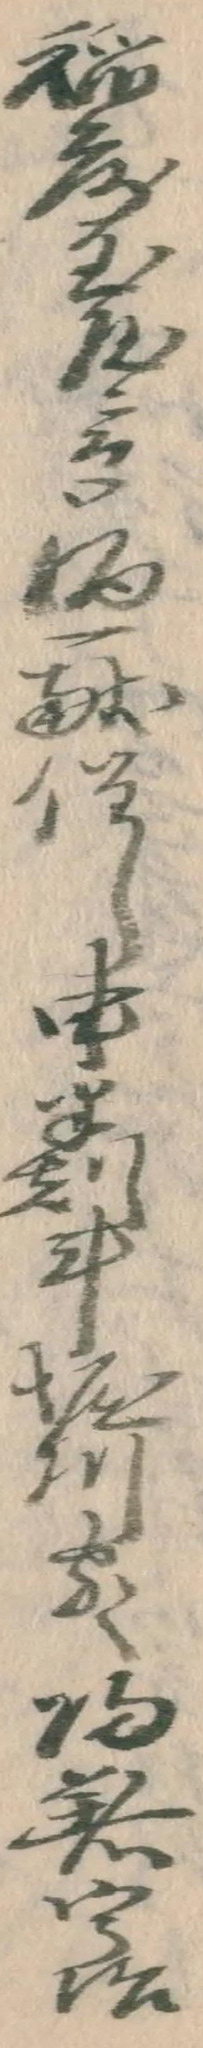稲荷玉屋ニ而御酒一献催し申半刻斗堀川家へ帰着宇治
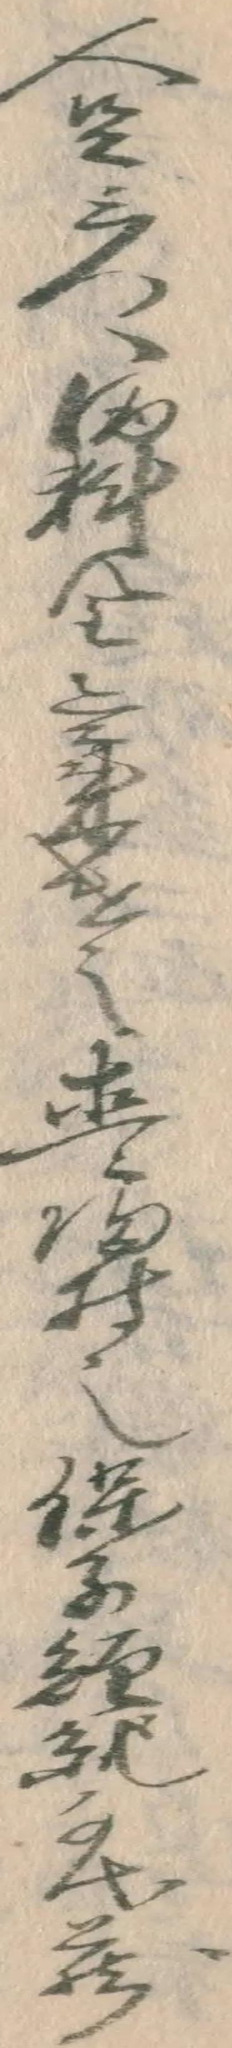人足三人へ酒料金壱朱遣之直々帰村也保子経紀千代蔵
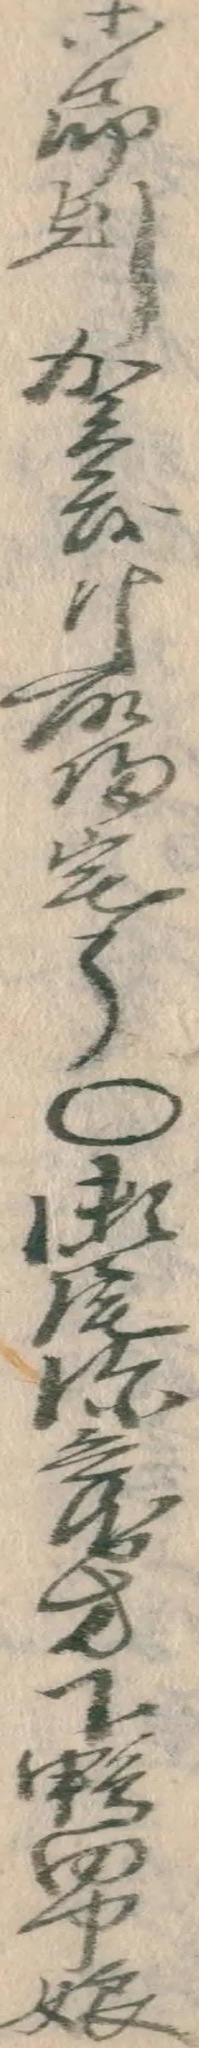等即刻賀茂引取帰宅了〇瀬尾弥兵衛方下鴨田中娘
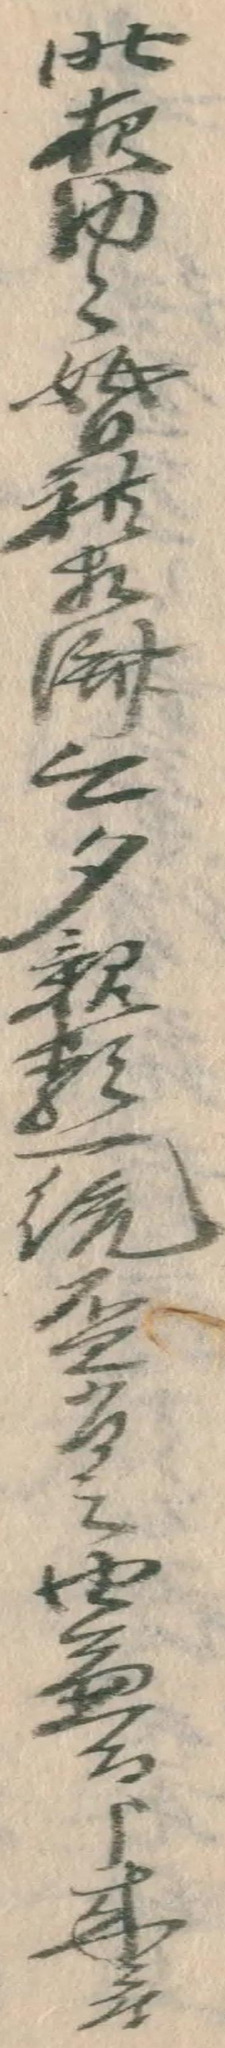昨夜内々婚禮相済今夕親類一統盃有之由兼而申来ニ付
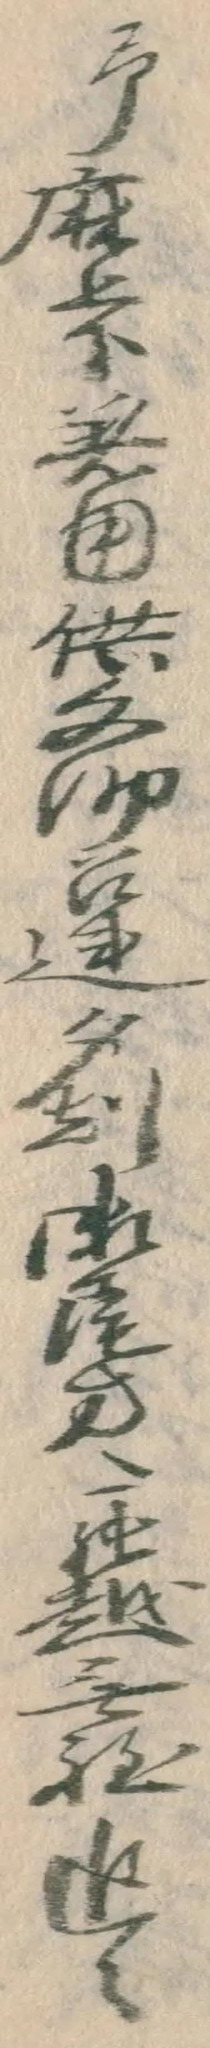予麻上下着用供文助召連夕刻瀬尾方へ罷越無程追々
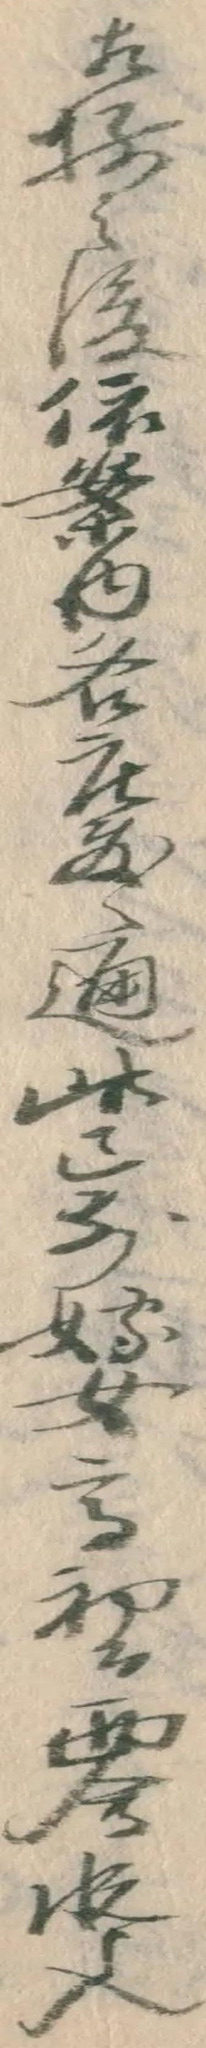相揃之後依案内各座敷へ通此已前嫁女高初而面會祝申入
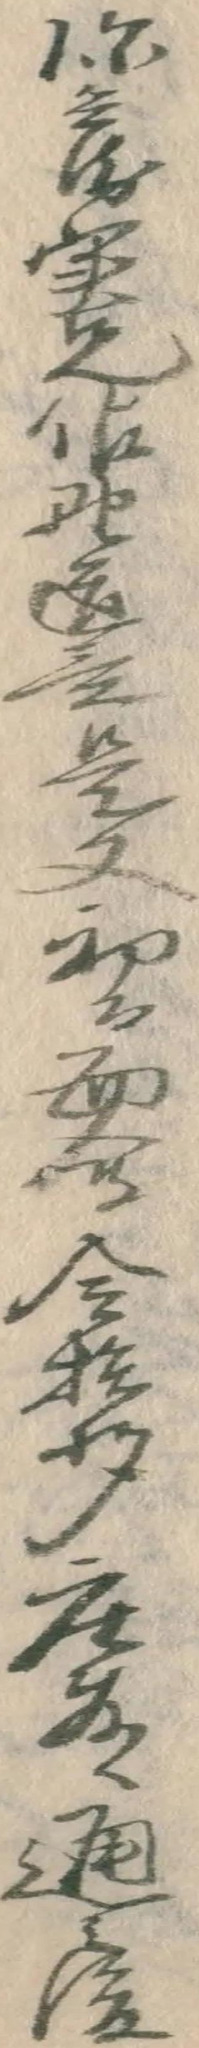弥兵衛実兄佐野遠益是又初而面會令挨拶座敷へ通之後
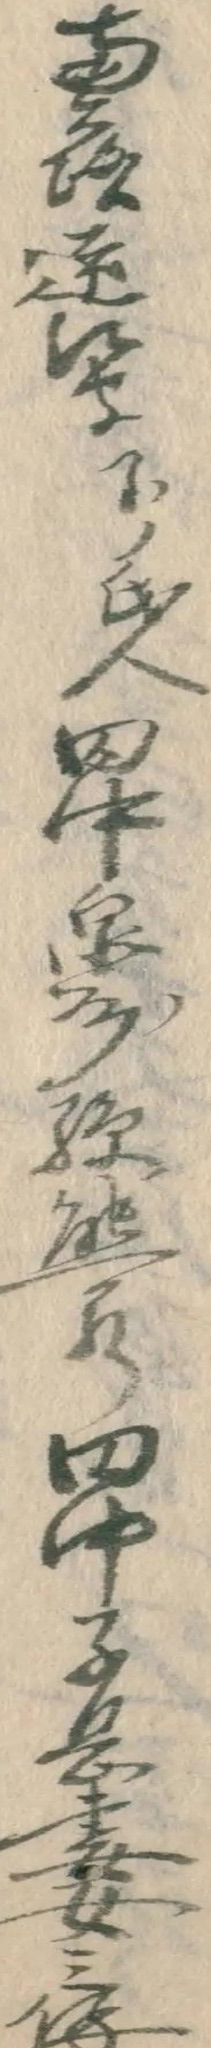南大路遠江守下ノ氏人田中泉州孫熊若田中子息妻女三
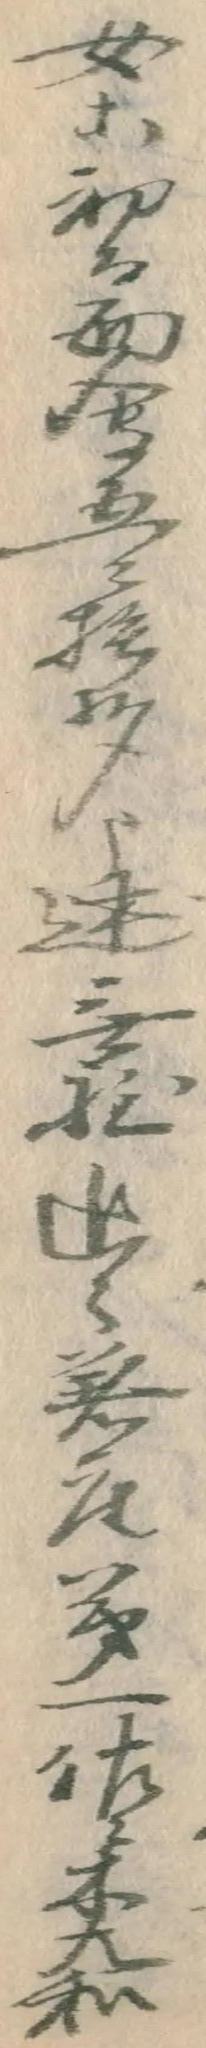女等初而面會互二挨拶申達無程追々着座第一佐々木九話

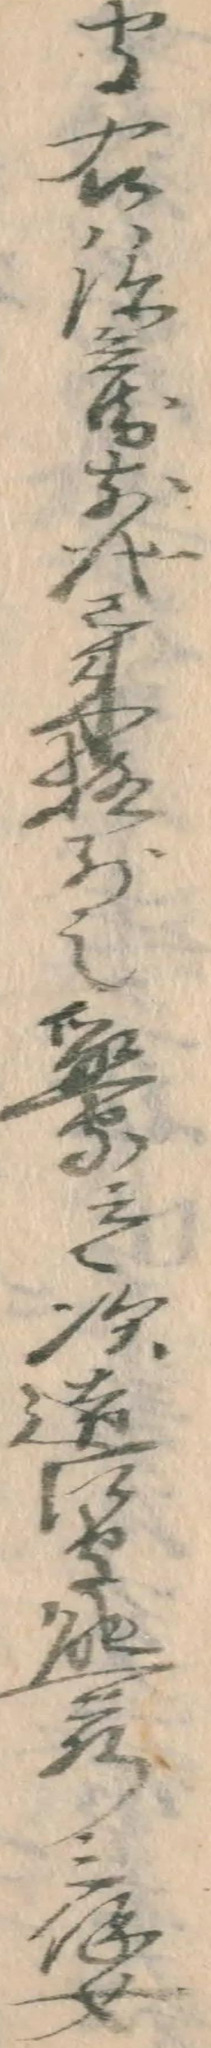守右ハ弥兵衛前代已来格別之配家云々次遠江守熊蔵三弥介
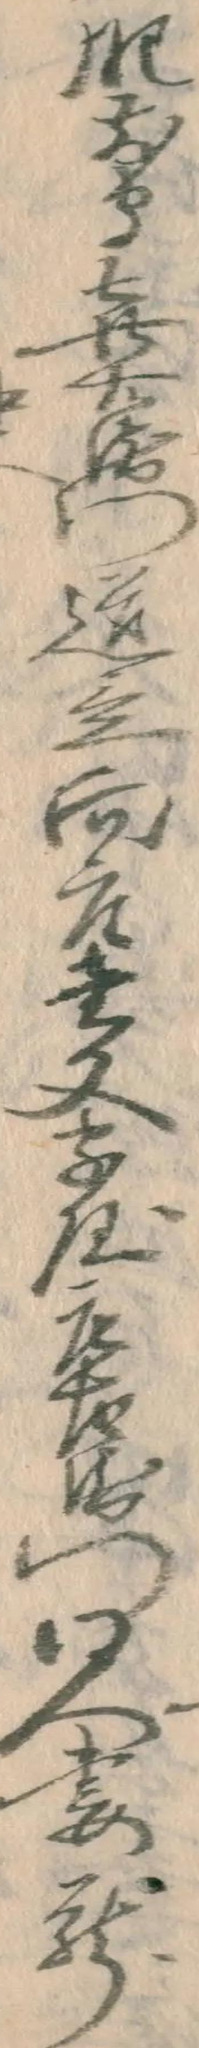肥前守喜右衛門道立向差遣又屋敷庄左衛門同人妻新
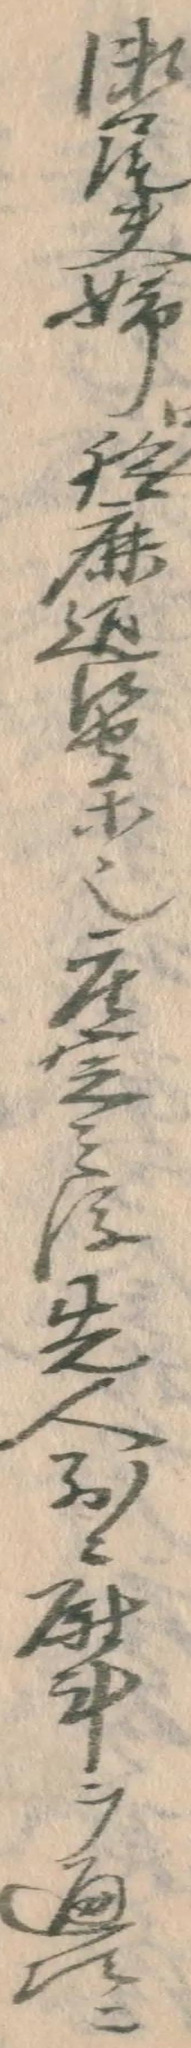瀬尾夫婦中人鈴鹿近江守等也座定之後先人別に熨斗ヲ通次ニ
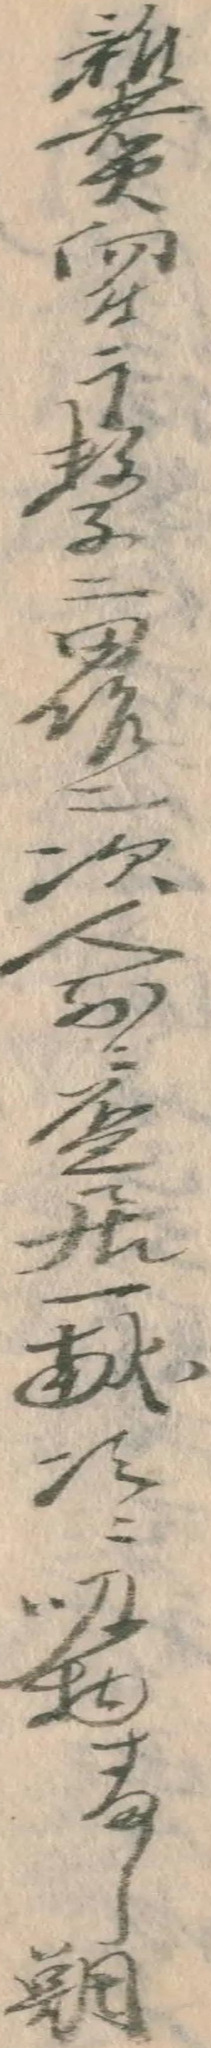雑煮向付干数子二田作二次人前二盃居一献次ニ吸物すまし鯛
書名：賀茂社記録. 第67冊
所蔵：国立国会図書館 National Diet Library, JAPAN
